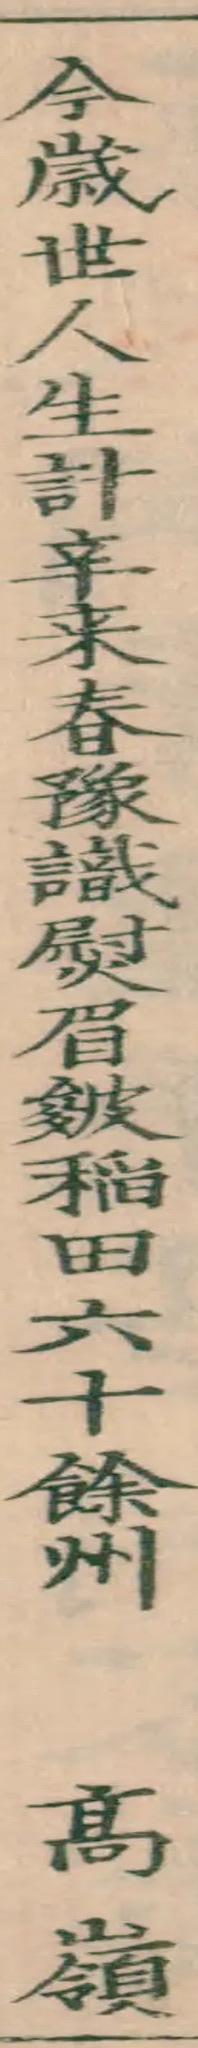今歳世人生計辛来春予識熨眉皴稲田六十余州高嶺
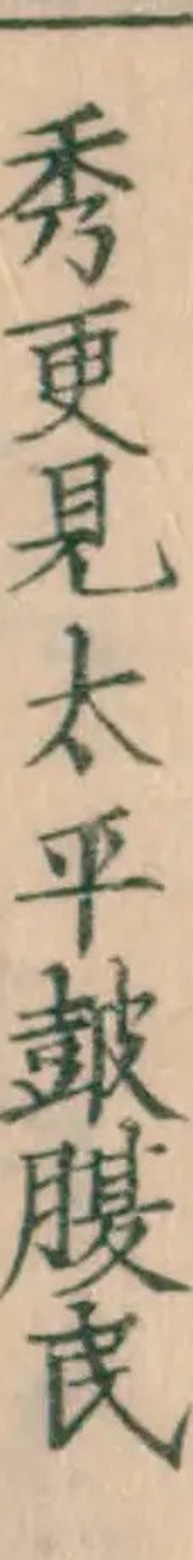秀更見太平鼓腹民
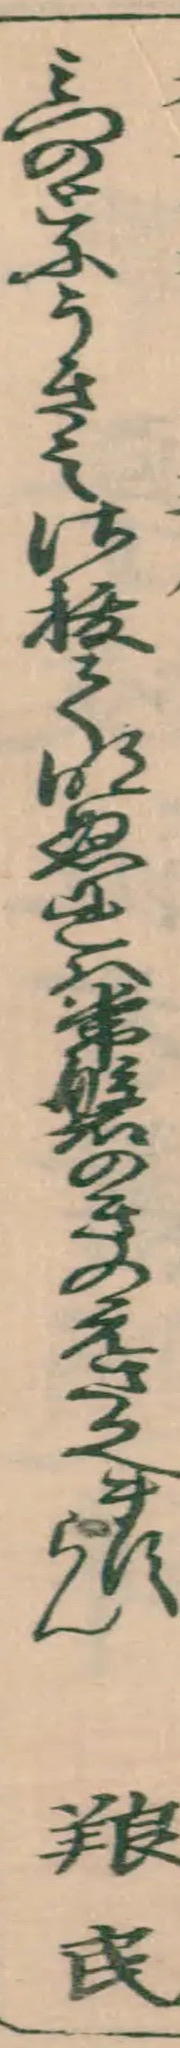みつのとにうきみ御抜て明ぬれは常磐のきのえさかへますらん羪民
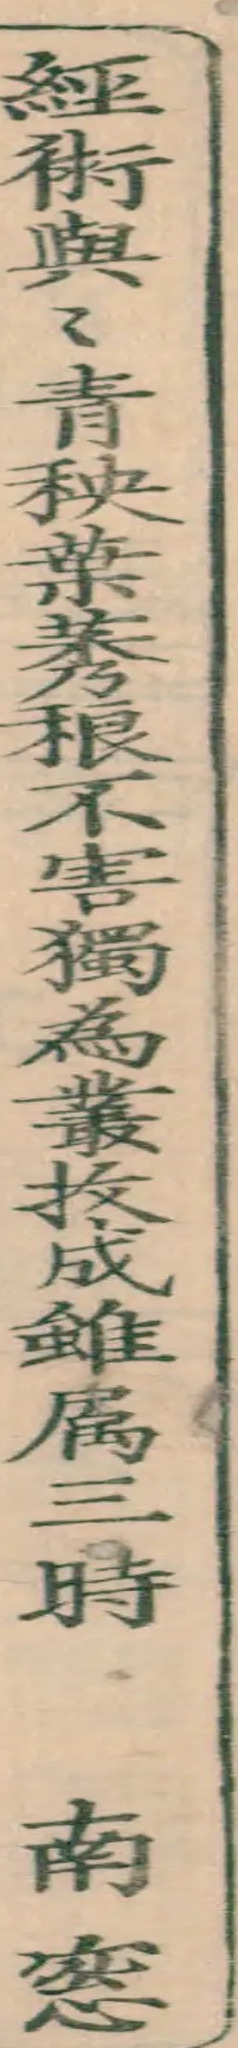経術与々青秧葉莠稂不害独為叢枚成雖属三時南窓
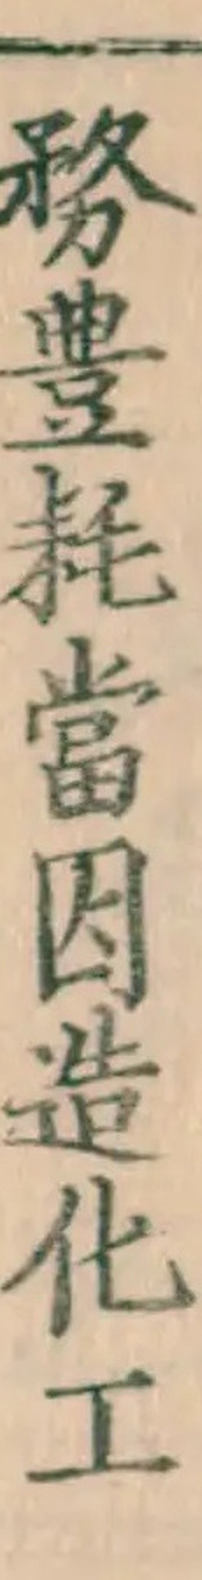務豊耗当因造化工
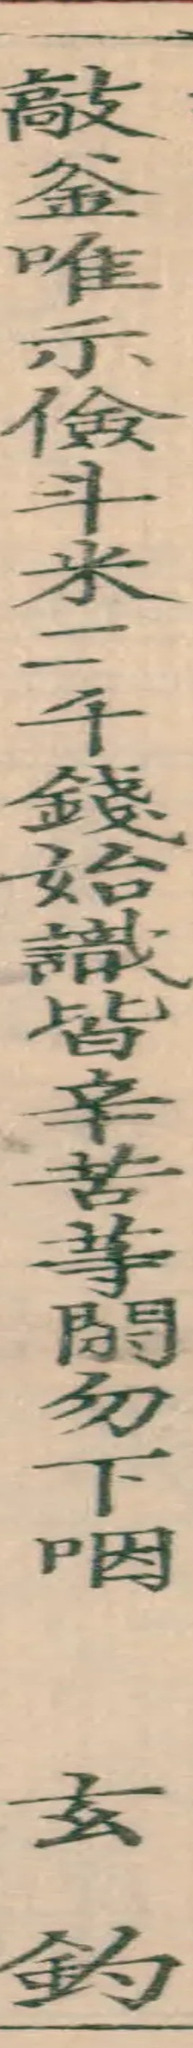敲釜唯示倹斗米二千銭始識皆辛苦䓁閑勿下咽玄釣
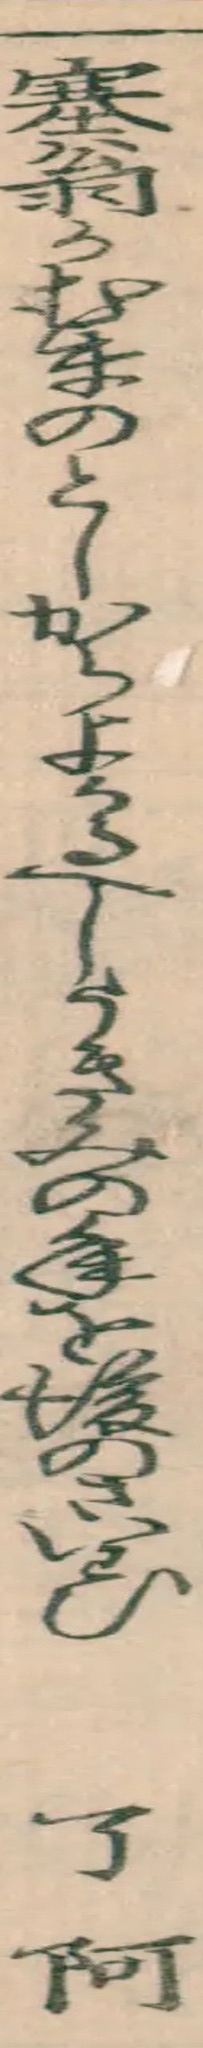塞翁かむまのとしからよかるへしうきみの年を後のさいわひ了阿
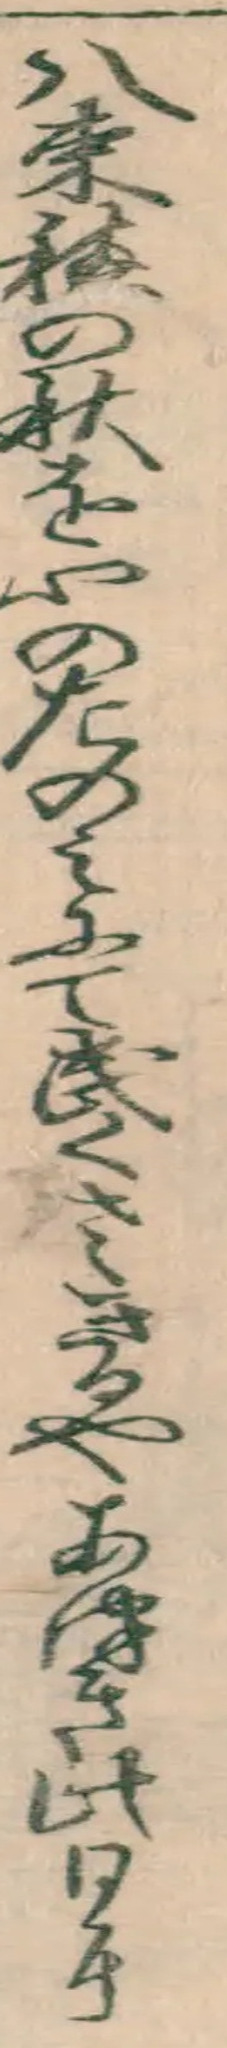八束穂の秋を心のたのみにて浅くさきるやあつき此日に善一
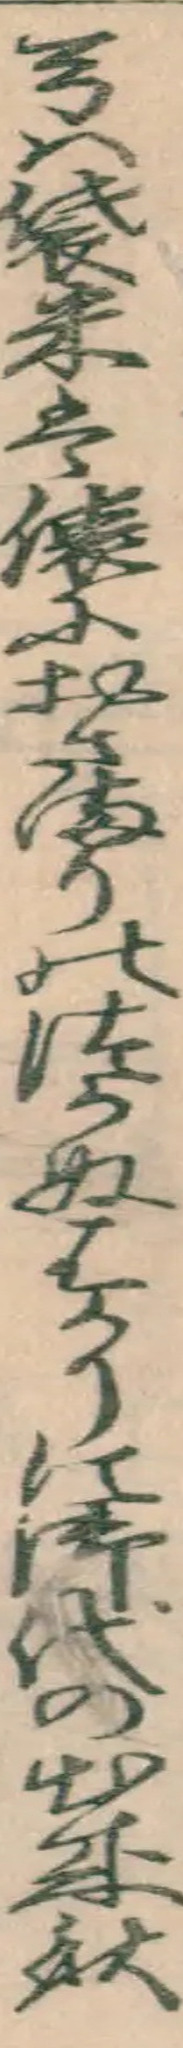弓は袋米は俵におさまりのつかぬはかりに御代の出来秋雪麿
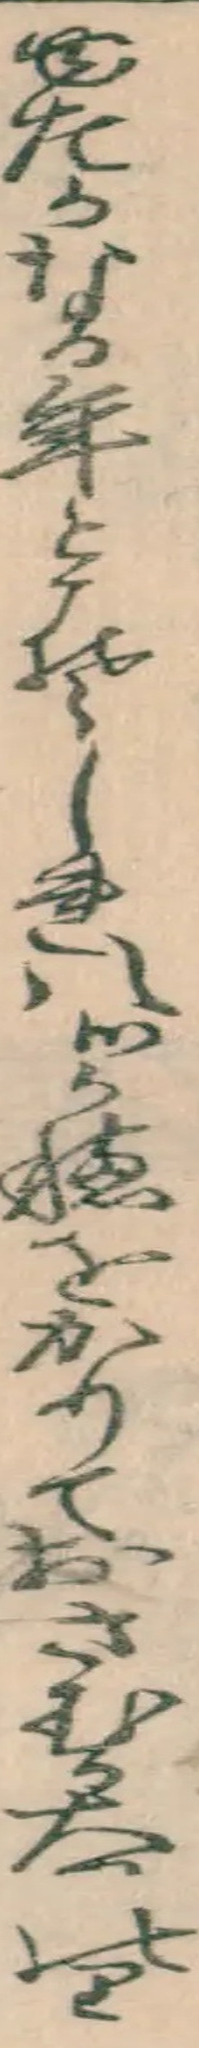ゆたかなる年とこそしれ八つか穂をかりておさむる大の里魯庵
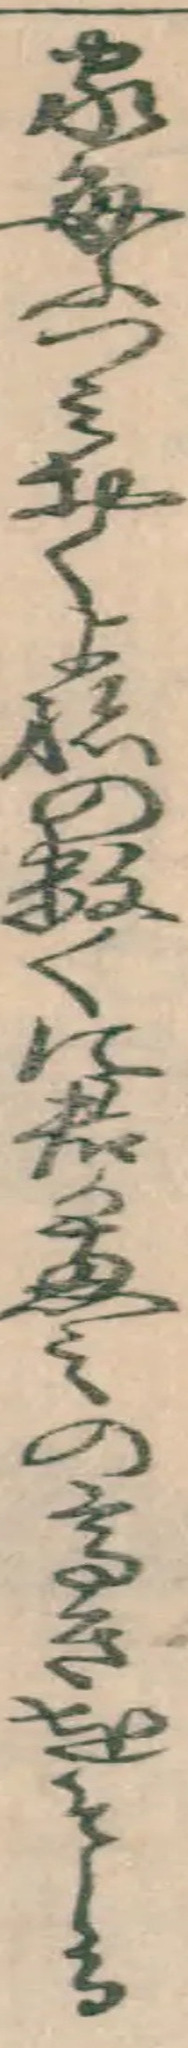家毎につみおくよねの数〳〵に君か恵みの高きをそしる上嘉
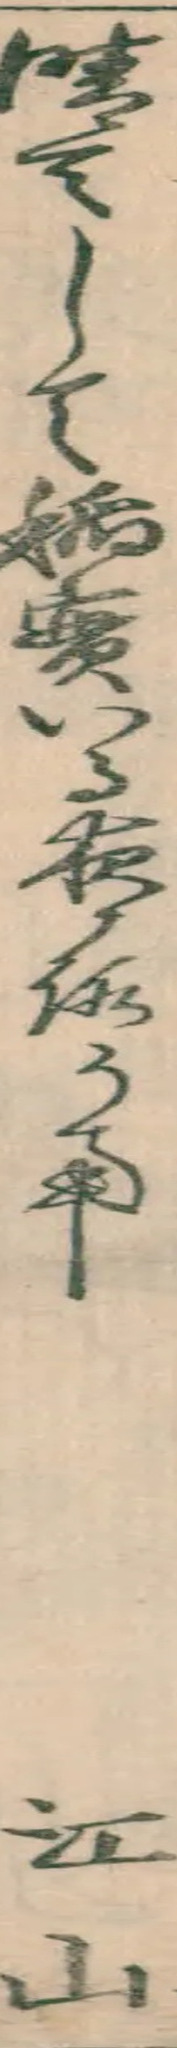晴てして稲実いる夜路かな江山
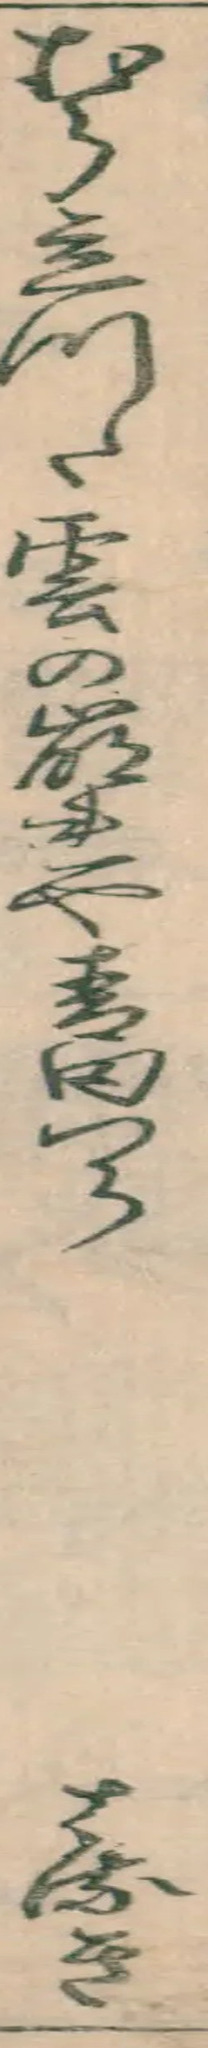むら立つた雲の崩れや青田つらはるき
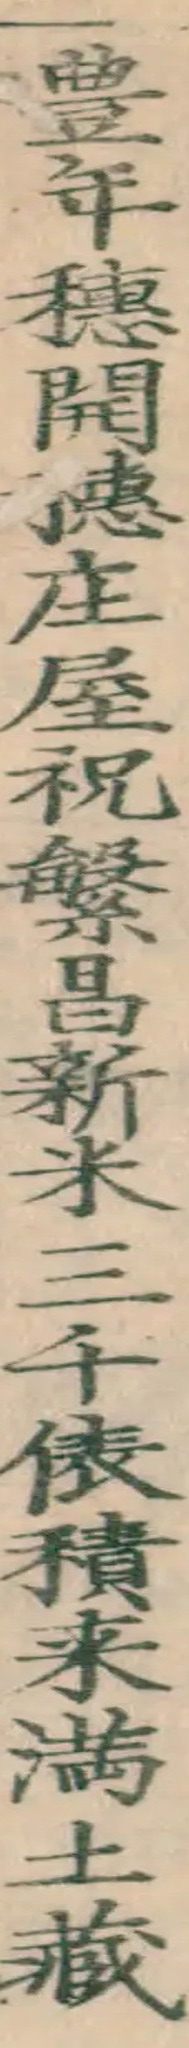豊年穂開穂庄屋祝繁昌新米三千俵積来満土蔵方外
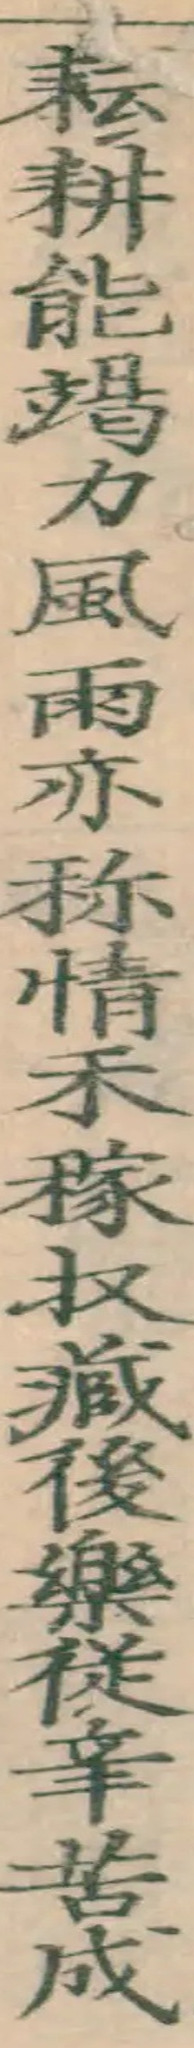耘耕能竭力風雨亦称情禾稼収蔵後楽従辛苦成琴台

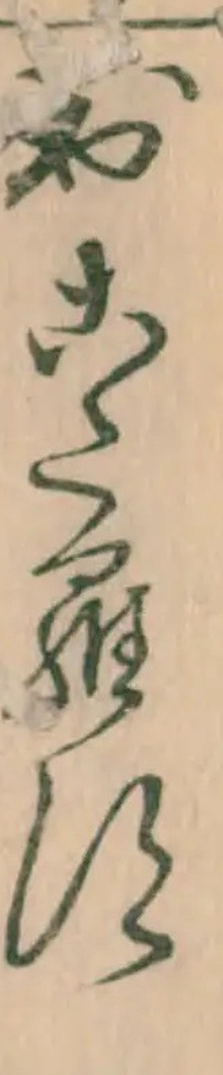おこたらす
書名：日ごとの心得
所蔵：国立国会図書館 National Diet Library, JAPAN
